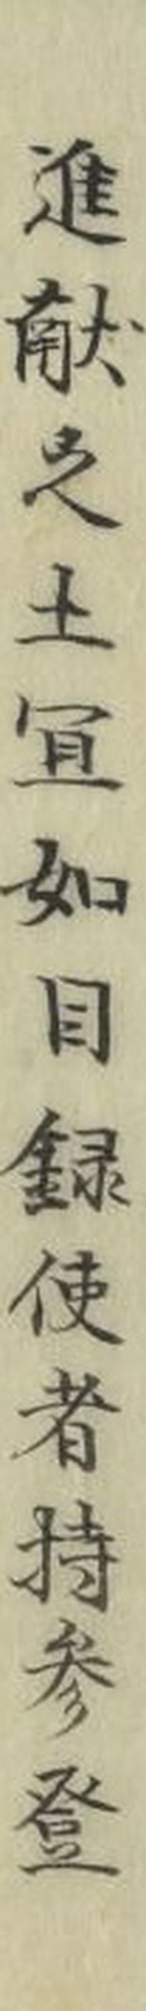進献之土宜如目録使者持参登
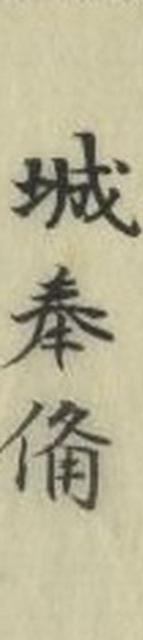城奉備
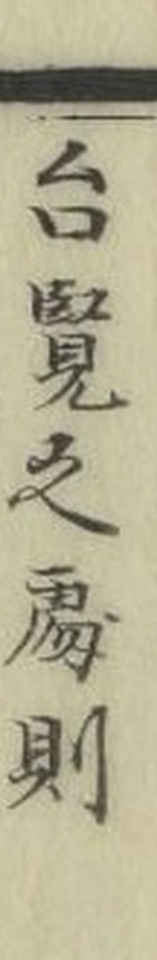台覧之處則
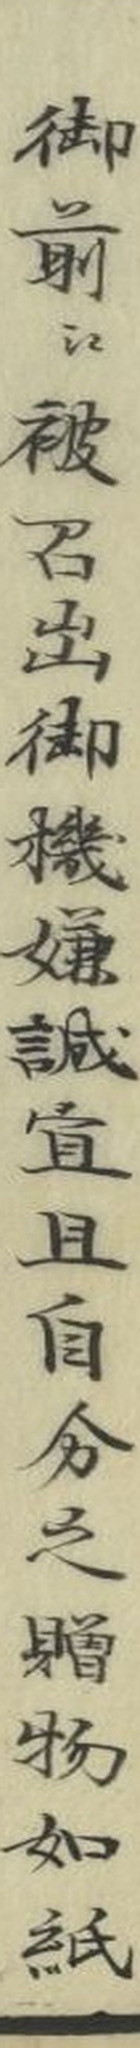御前え被召出御機嫌誠宜且自分之贈物如紙
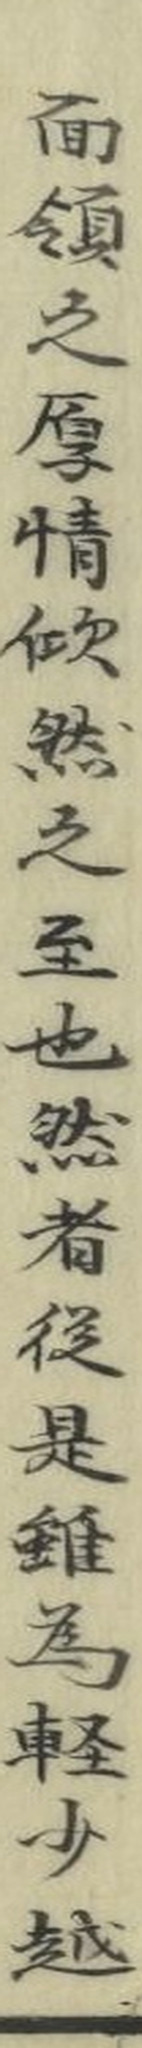面領之厚情欣然之至也然者従是雖為軽少越
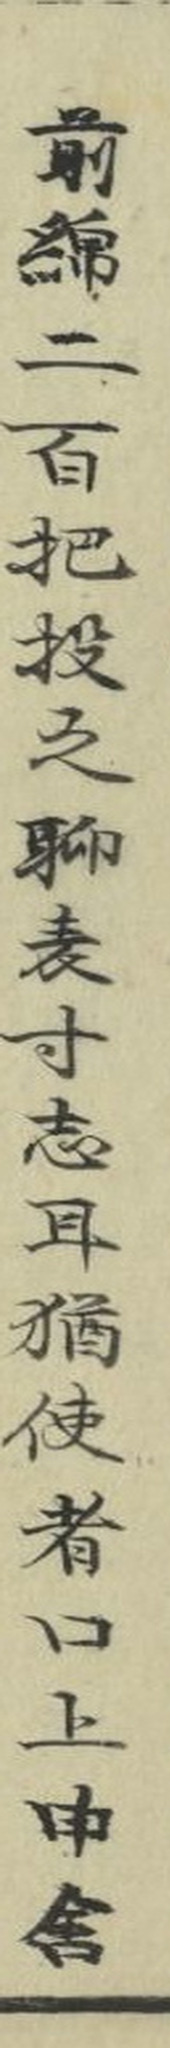前綿二百把投之聊表寸志耳猶使者口上申含
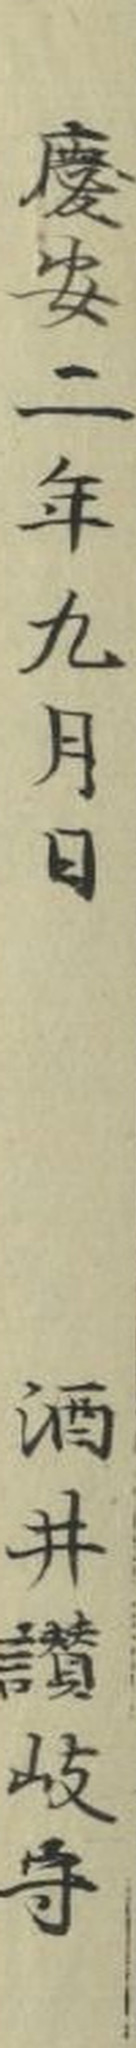慶安二年九月日酒井讃岐守
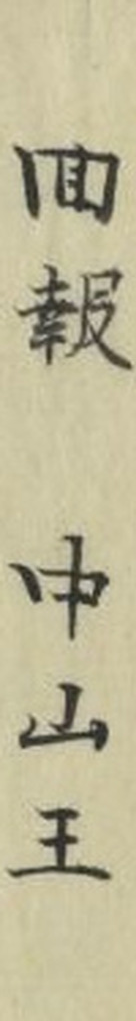回報中山王
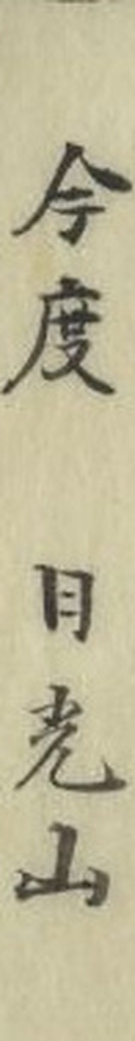今度日光山
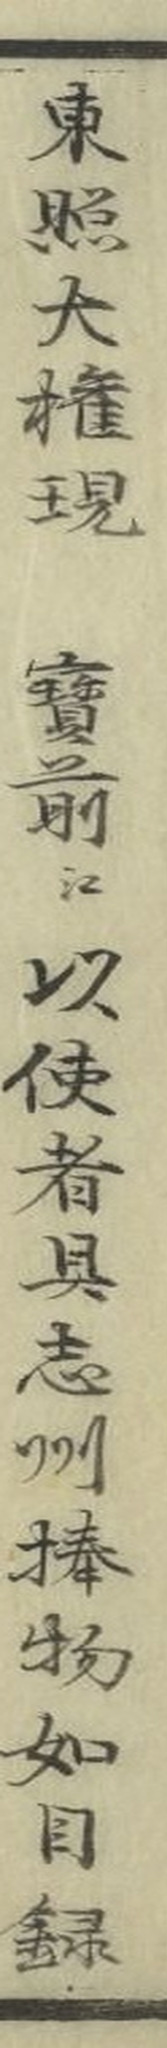東照大権現宝前え以使者具志州捧物如目録
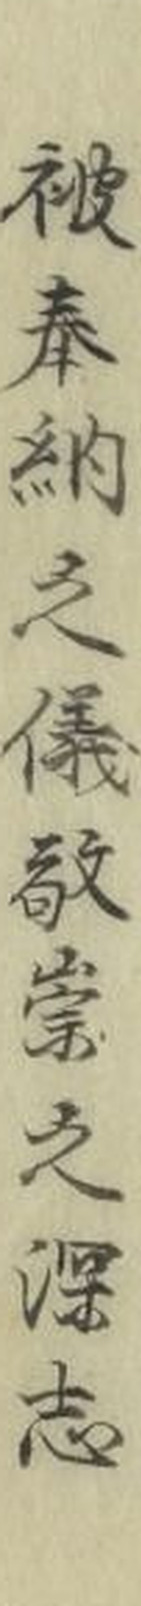被奉納之儀敬崇之深志
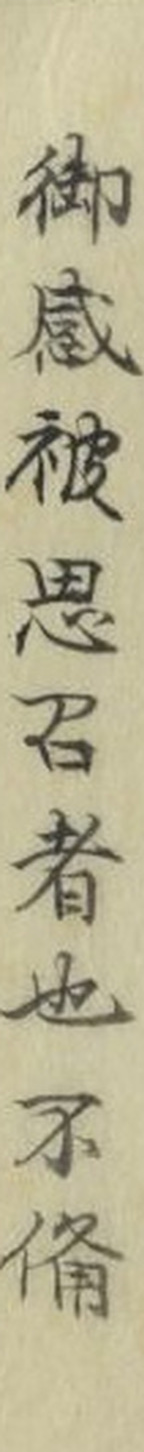御感被思召者也不備

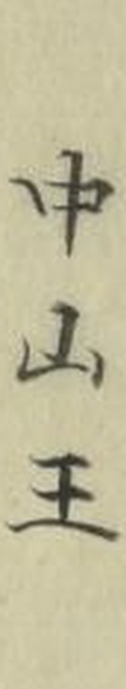中山王
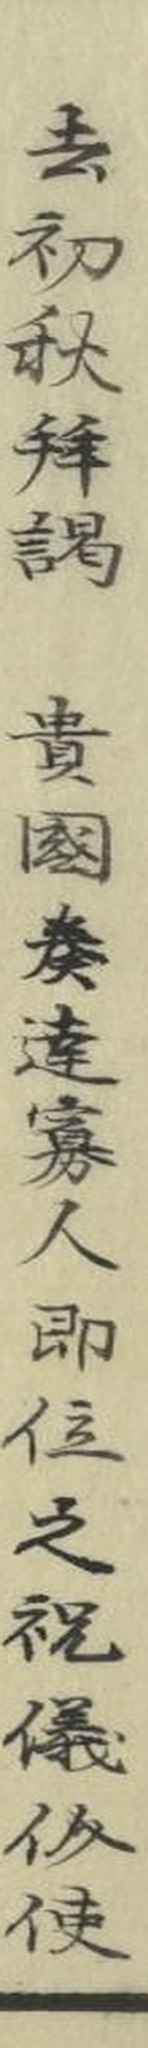去初秋拝謁貴国奏達寡人即位之祝儀价使
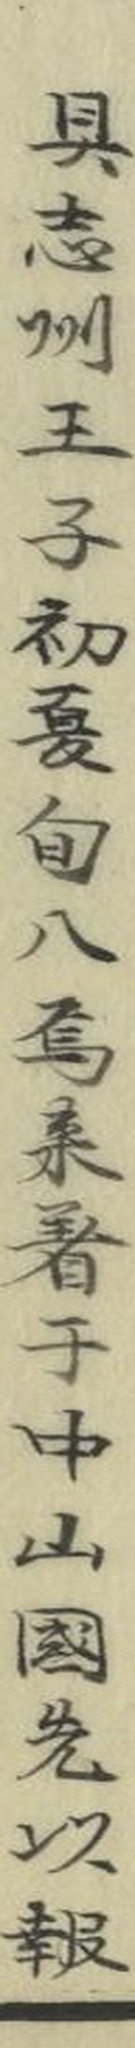具志州王子初夏旬八焉来着于中山国先以報
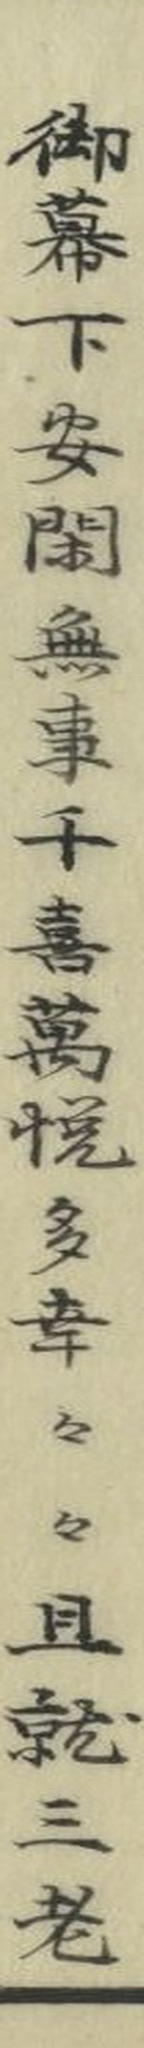御幕下安閑無事千喜万悦多幸々々且就三老
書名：琉球往来（上）
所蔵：University of the Ryukyus Library
